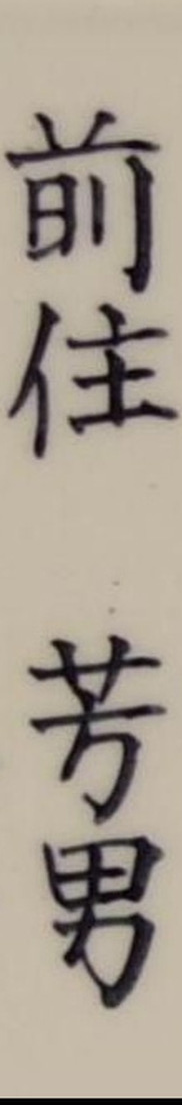前住芳男
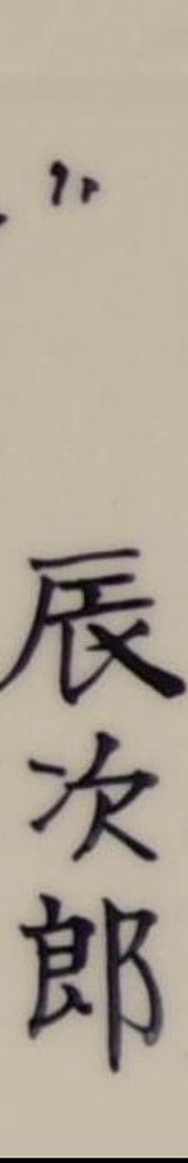辰次郎
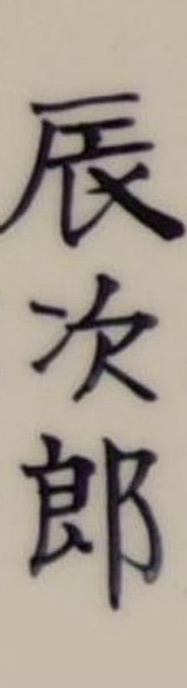辰次郎
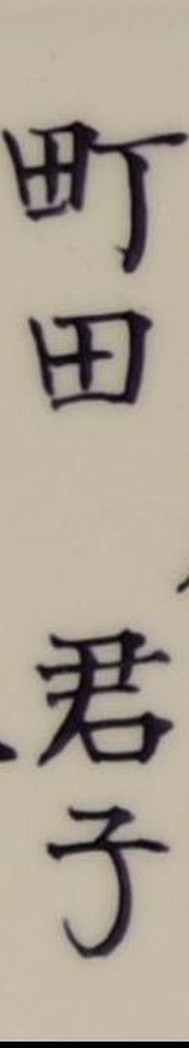町田君子
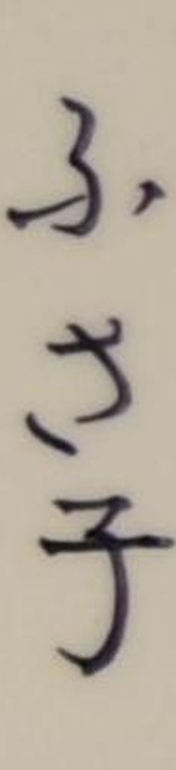ふさ子
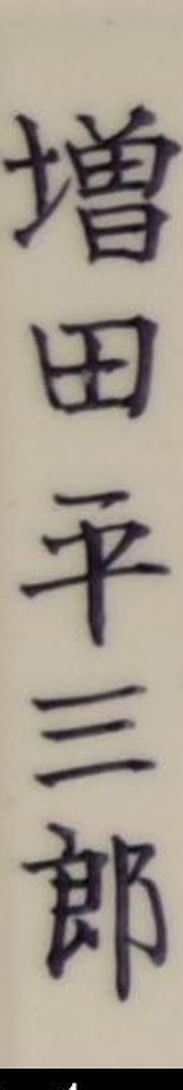増田平三郎

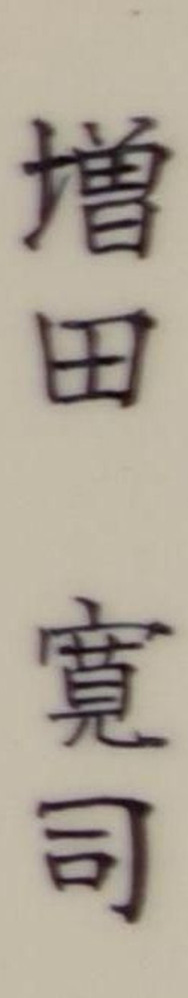増田寛司
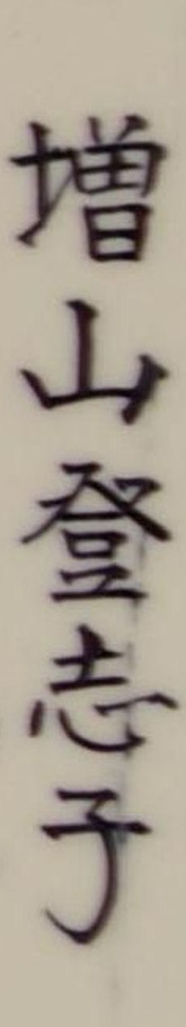増山登志子
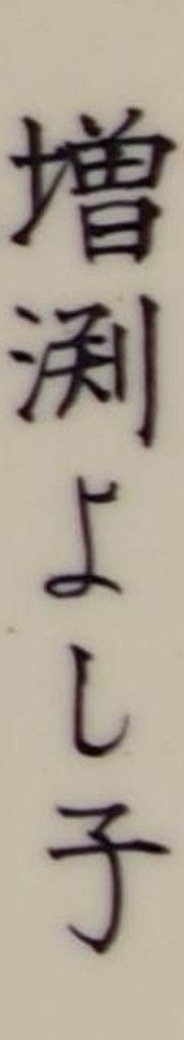増渕よし子
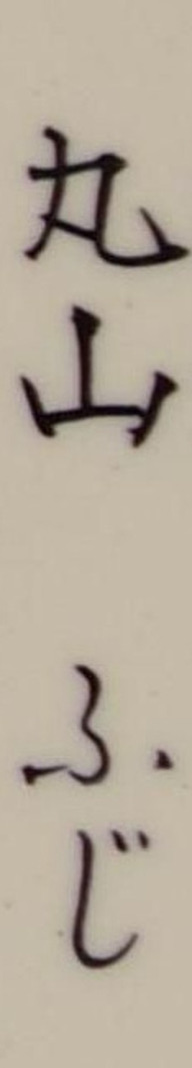丸山ふじ
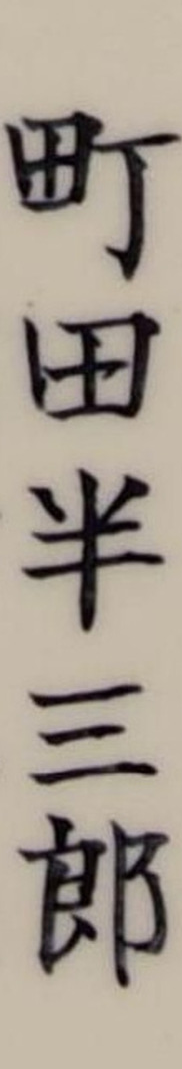町田半三郎
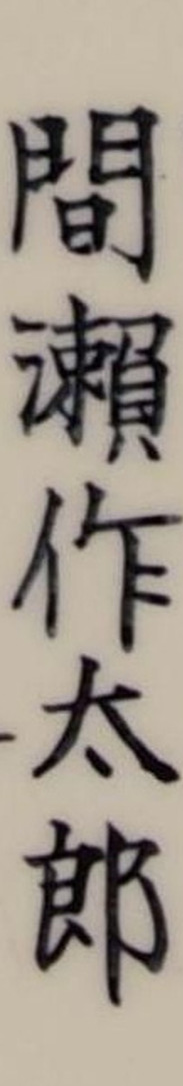間瀬作太郎
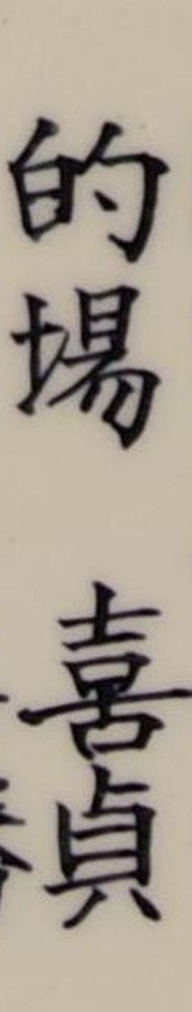的場喜貞
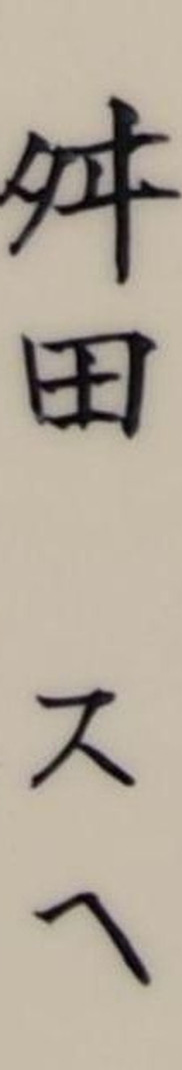舛田スヘ
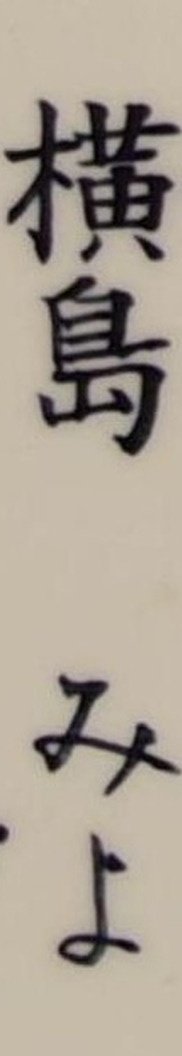横島みよ
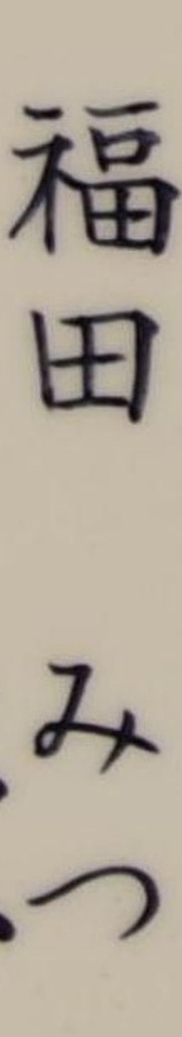福田みつ
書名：E~L
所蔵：高野山金剛峯寺
